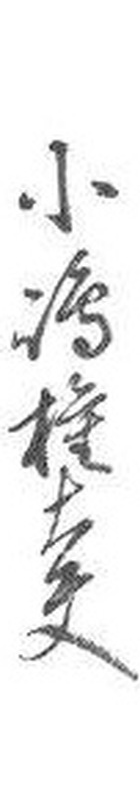小嶋権太夫
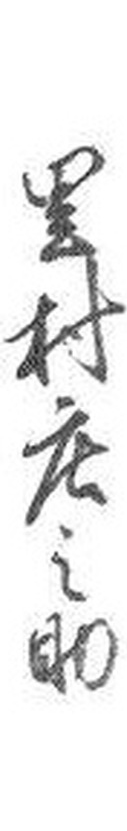里村庄之助
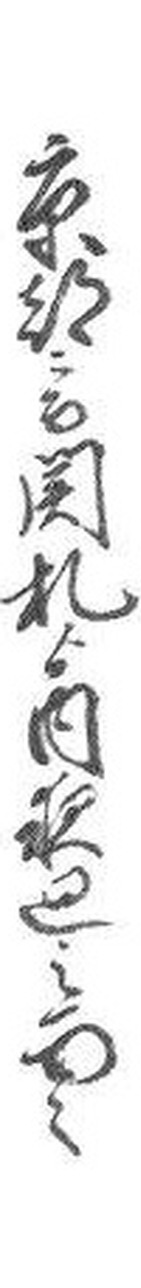京都ニ而関札ゟ内夜廻之面々
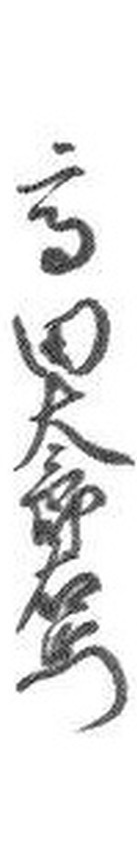高田太郎右衛門
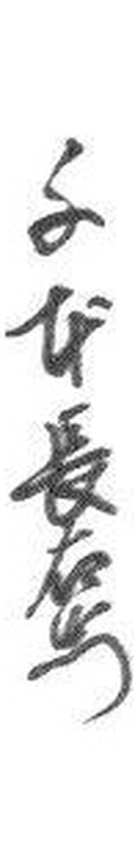千本長右衛門
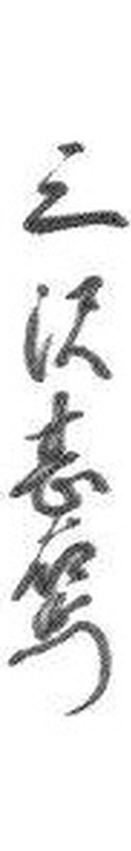三沢甚右衛門
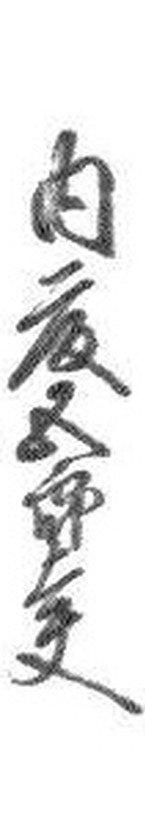内藤五郎太夫
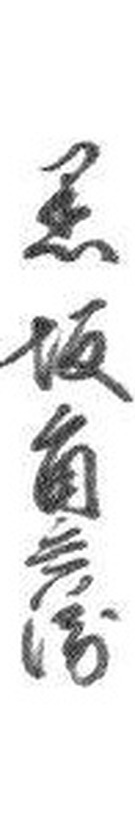黒坂角兵衛
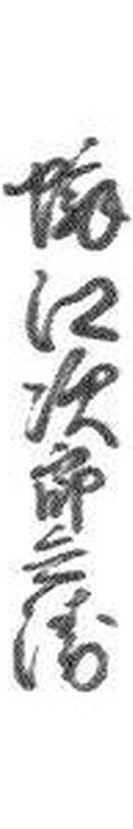蟹江次郎兵衛
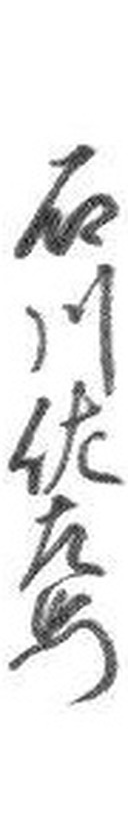石川佐左衛門
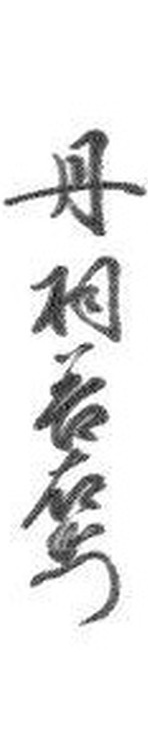丹羽善右衛門
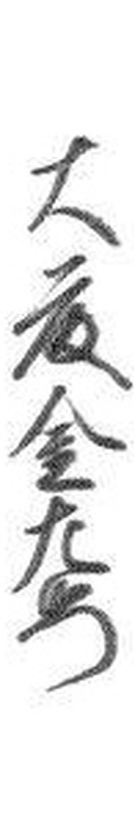大藤金左衛門

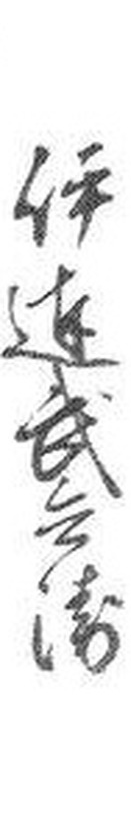伊達武兵衛
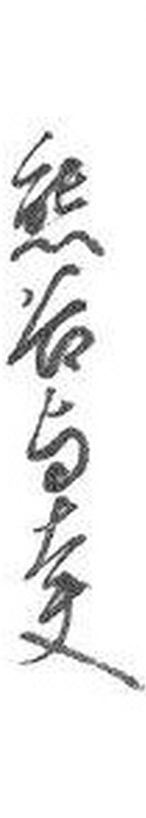熊谷与太夫
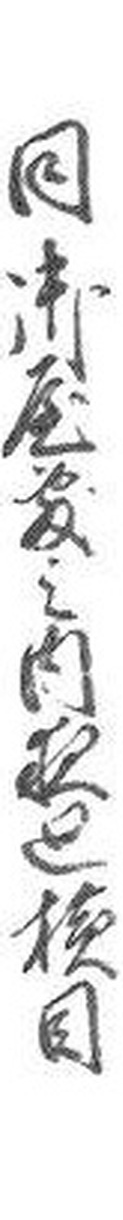同御屋敷之内夜廻横目
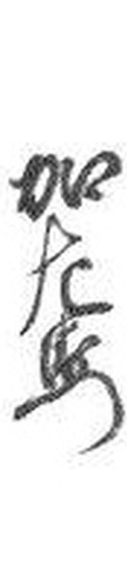畑加左衛門
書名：家譜 四 忠昌公 従寛永七年到正保四年
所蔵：福井県文書館 Fukui Prefectural Archives
